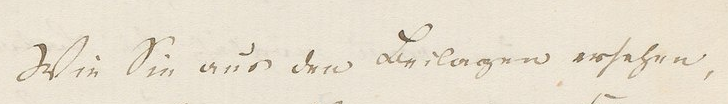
Wie Sie aus den Beilagen ersehen,
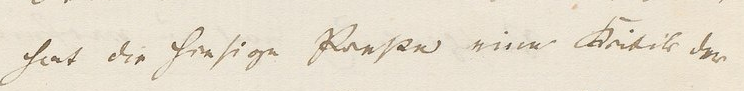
hat die hiesige Preße eine Kritik der
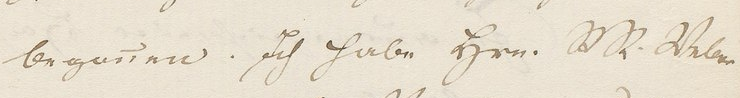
begonnen. Ich habe Hrn. RR. Weber
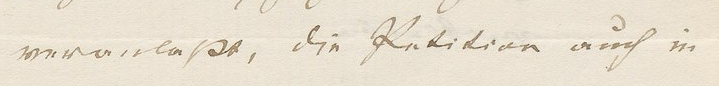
veranlaßt, die Petition auch in
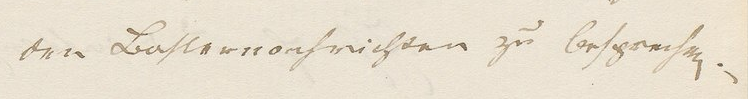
den Baslernachrichten zu besprechen. –
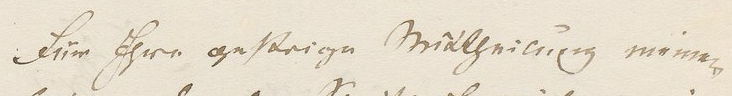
Für Ihre gestrige Mittheilung meinen
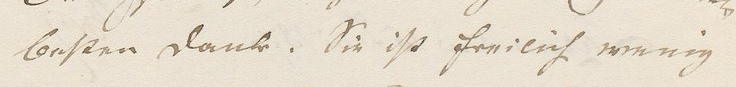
besten Dank. Sie ist freilich wenig
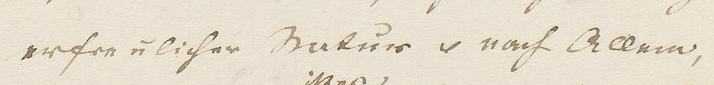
erfreulicher Natur & nach Allem,
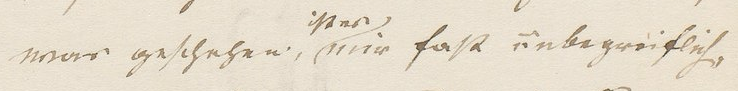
was geschehen, ist es mir fast unbegreiflich,
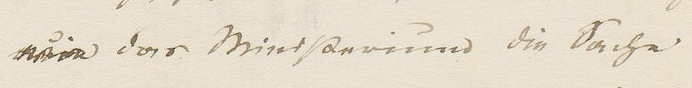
wie das Ministerium die Sache
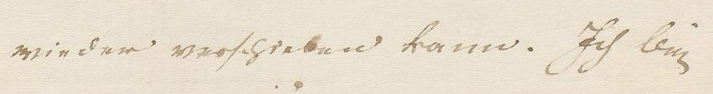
wieder verschieben kann. Ich bin
